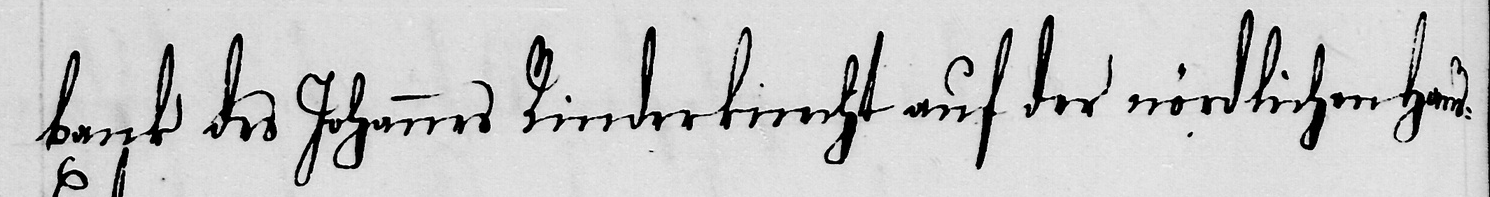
bank des Johannes Rinderknecht auf der nördlichen Ha¬
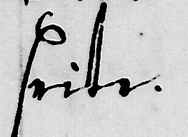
seite.
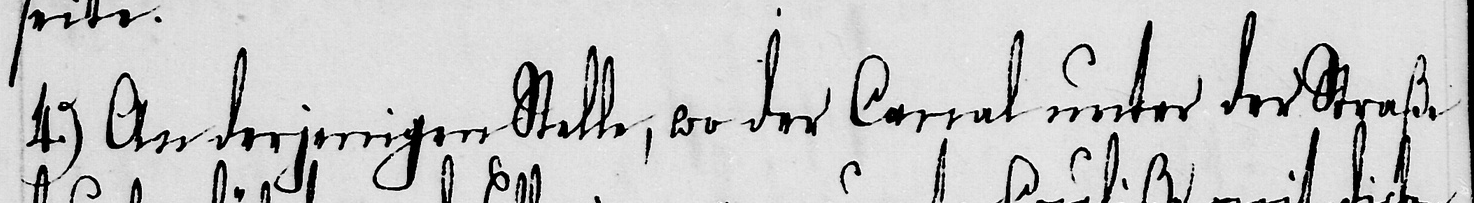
4.) An derjenigen Stelle, wo der Canal unter der Straße
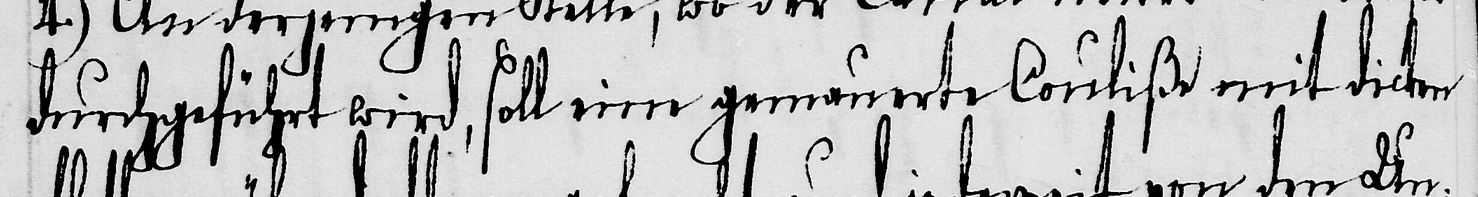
durchgeführt wird, soll eine gemauerte Couliße mit dicken
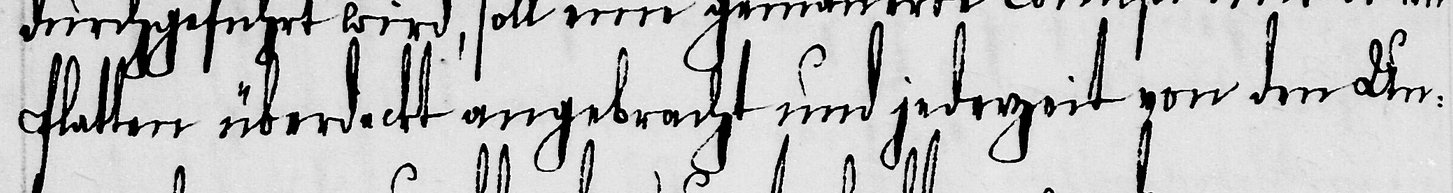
Spalten überdeckt angebracht und jederzeit von den Un¬
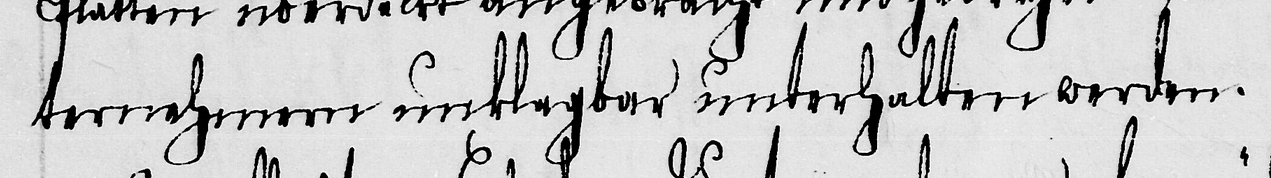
ternehmern unklagbar unterhalten werden.
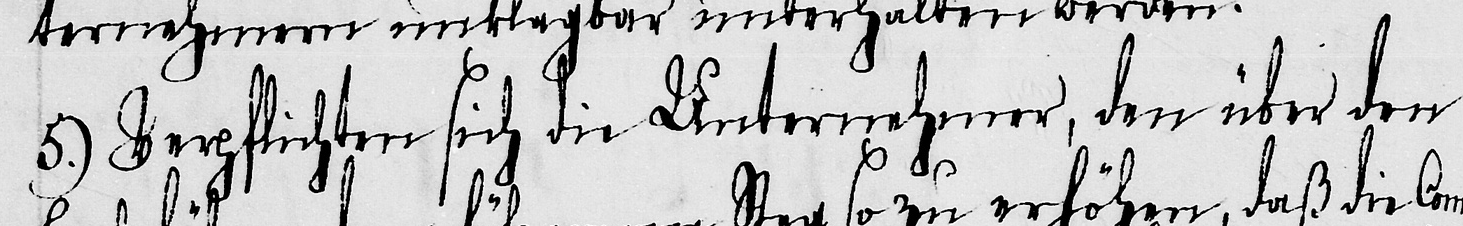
5.) Verpflichten sich die Unternehmer, den über den
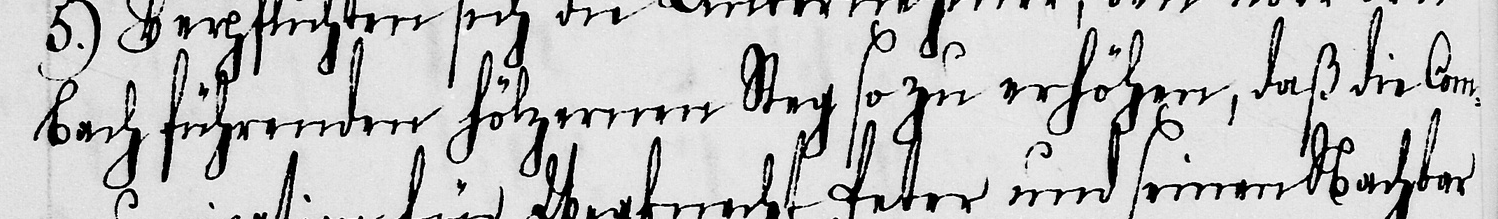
Bach führenden hölzernen Steg so zu erhöhen, daß die Com¬
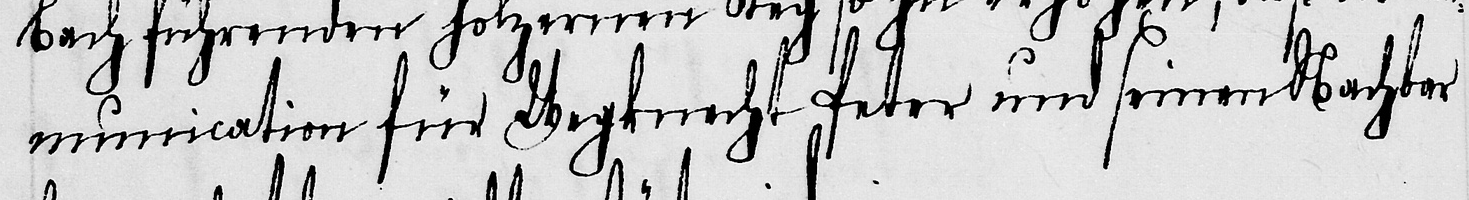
munication für Wegknecht Peter und seinen Nachbar
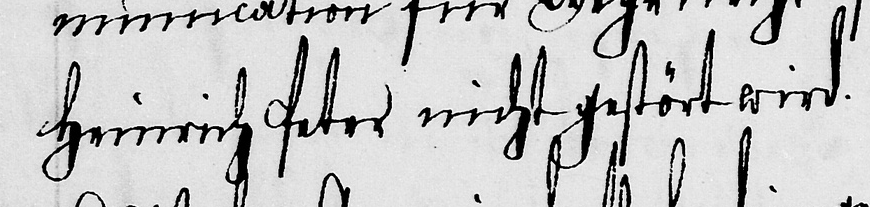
Heinrich Peter nicht gestört wird.
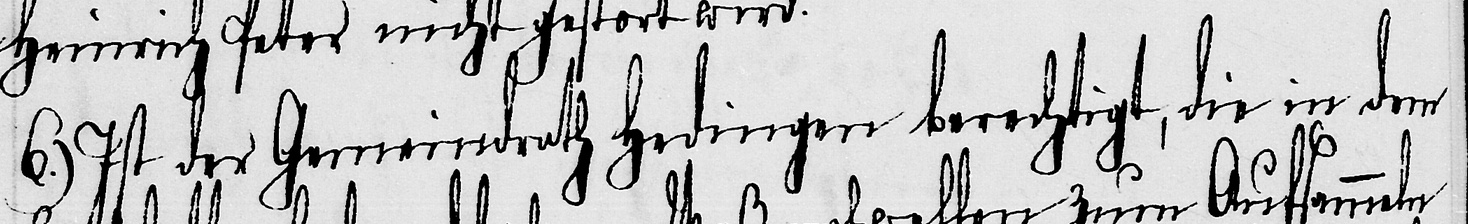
6.) Ist der Gemeindrath Hedingen berechtigt, die in dem
